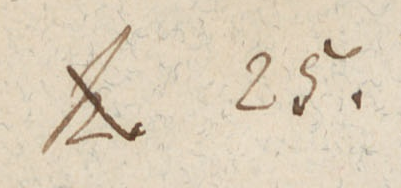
h 25.
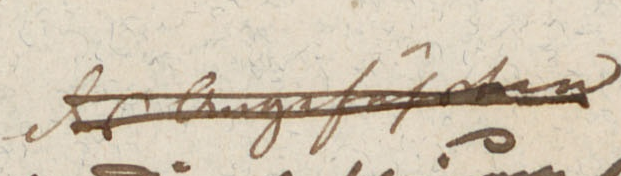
desr Steinkonstruktion
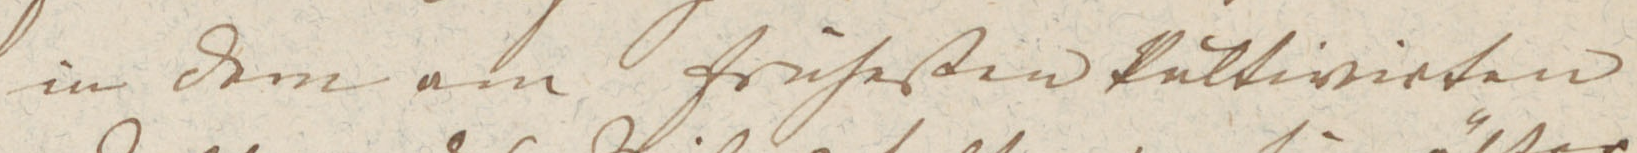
in dem am frühesten kultivirten
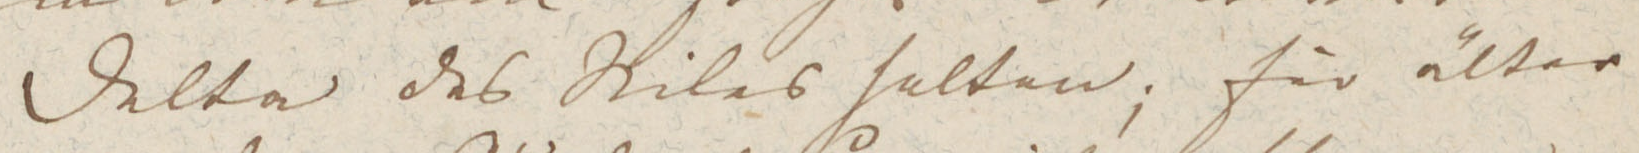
Delta des Niles halten; für älter
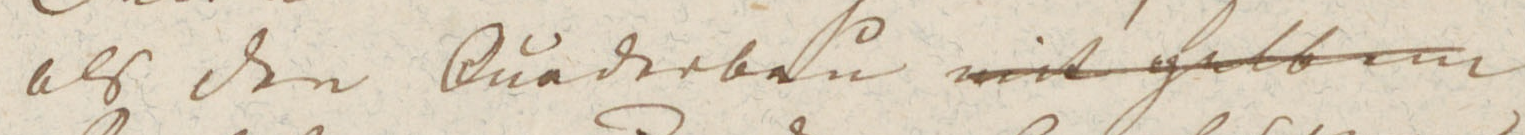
als den Quaderbau mit gelbem
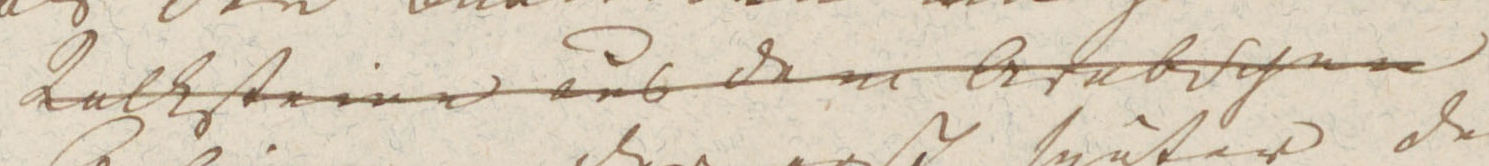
Kalksteine aus dem Arabischen
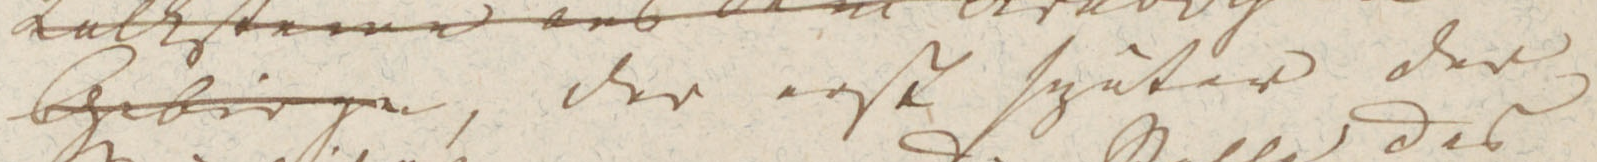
Gebirge, der erst später der
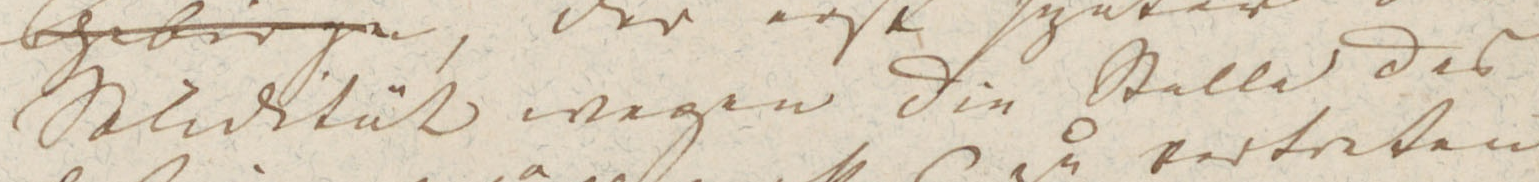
Solidität wegen die Stelle des
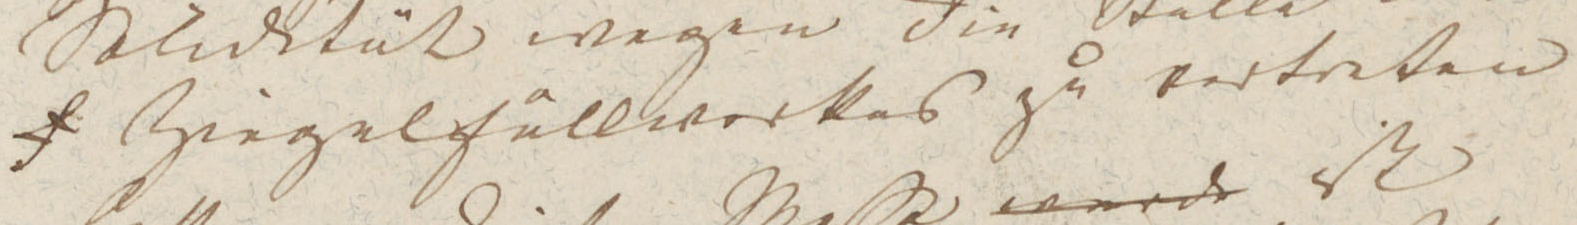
f Ziegelfüllwerkes zu vertreten
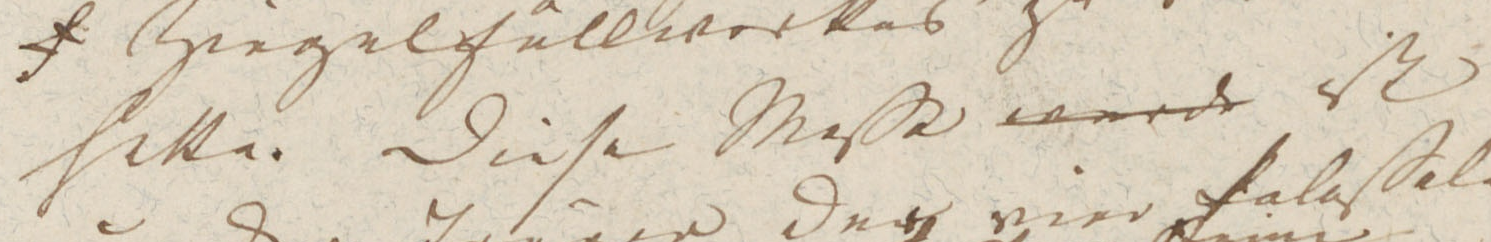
hatte. Diese Masse wurde ist
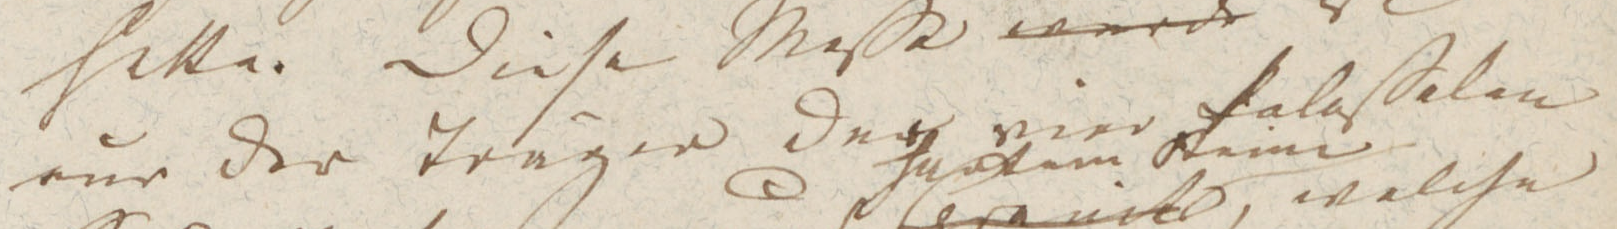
nur der Träger der vier kolossalen
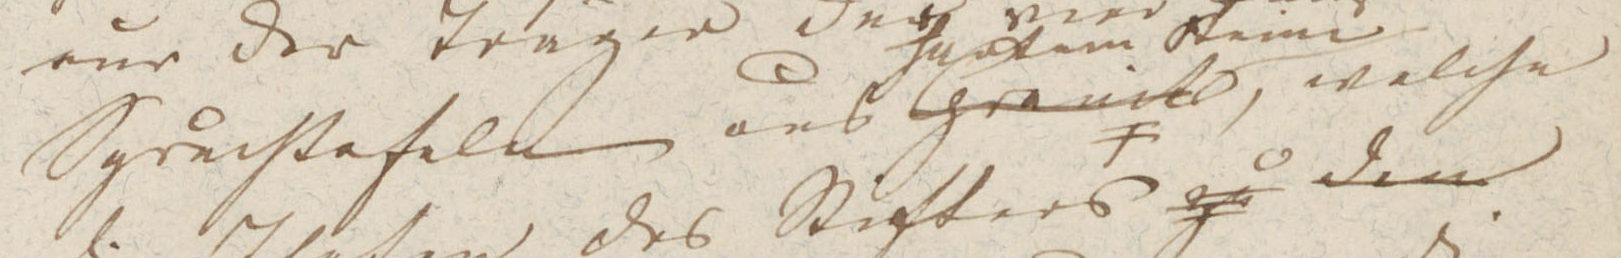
Spruchtafeln aus Granit hartem Steine, welche
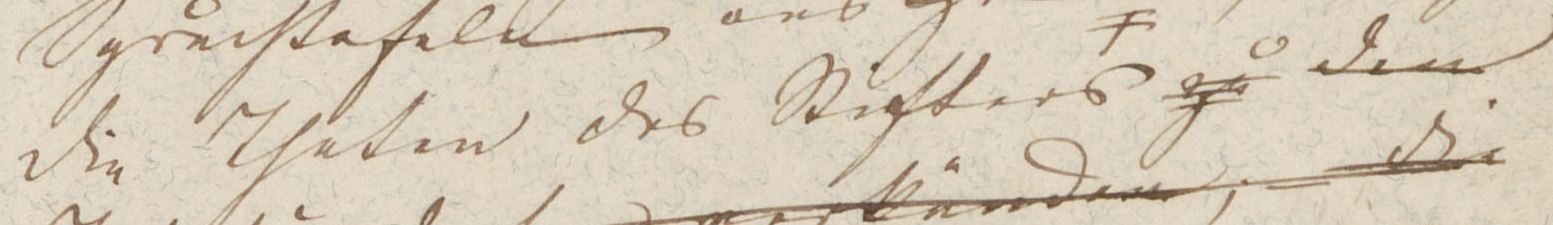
die Thaten des Stifters % zu den
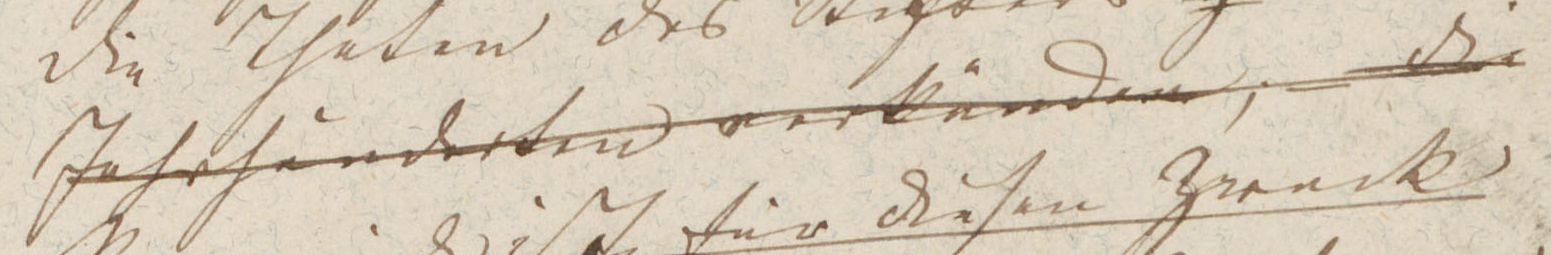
Jahrhunderten verkünden; - Die
